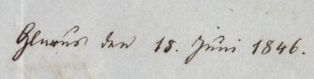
Glarus den 15. Juni 1846.
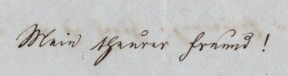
Mein theurer Freund!
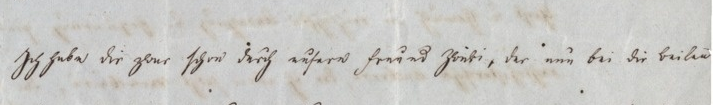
Ich habe dir zwar schon durch unsern FreundZwicki, der nun bei dir weilen
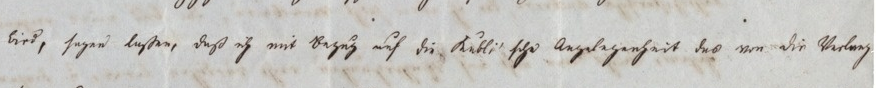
wird, sagen lassen, daß ich mit Bezug auf die Kubli'sche Angelegenheit das von dir Verlang-
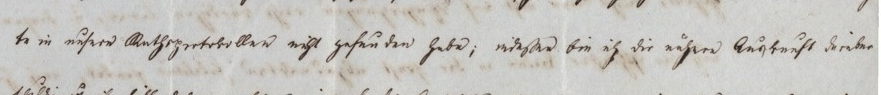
te in unsern Rathsprotokollen nicht gefunden habe; indessen bin ich dir nähere Auskunft darüber
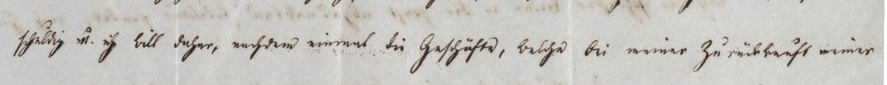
schuldig u. ich will daher, nachdem einmal die Geschäfte, welche bei meiner Zurückkunft meiner
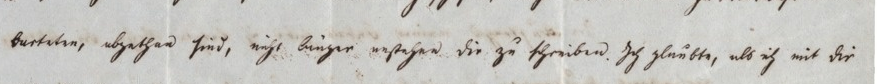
warteten, abgethan sind, nicht länger anstehen dir zu schreiben. Ich glaubte, als ich mit dir
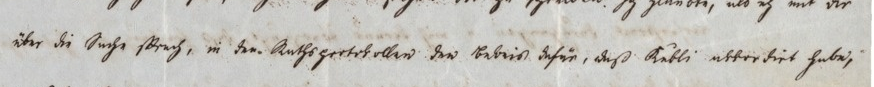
über die Sache sprach, in den Rathsprotokollen den Beweis dafür, daß Kubli akkordirt habe,
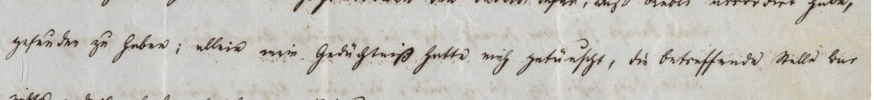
gefunden zu haben; allein mein Gedächtniß hatte mich getäuscht, die betreffende Stelle war
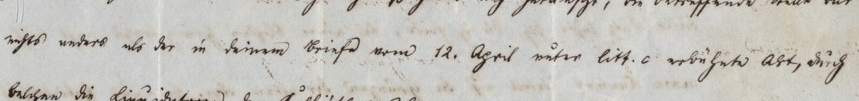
nichts anders als der in deinem Briefe vom 12. April unter litt. c erwähnte Akt, durch
